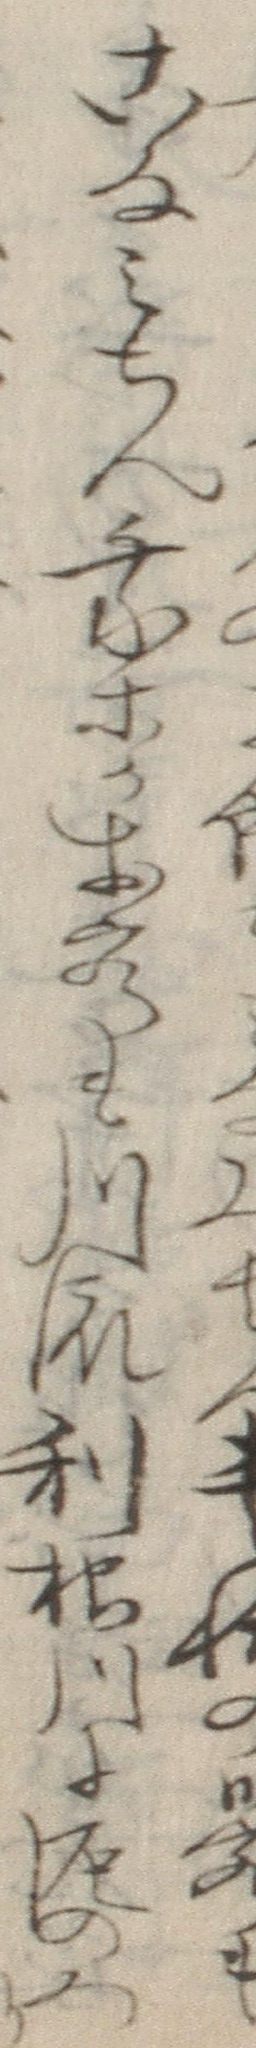こなみちん我等かお客も川流利根川に泥のう
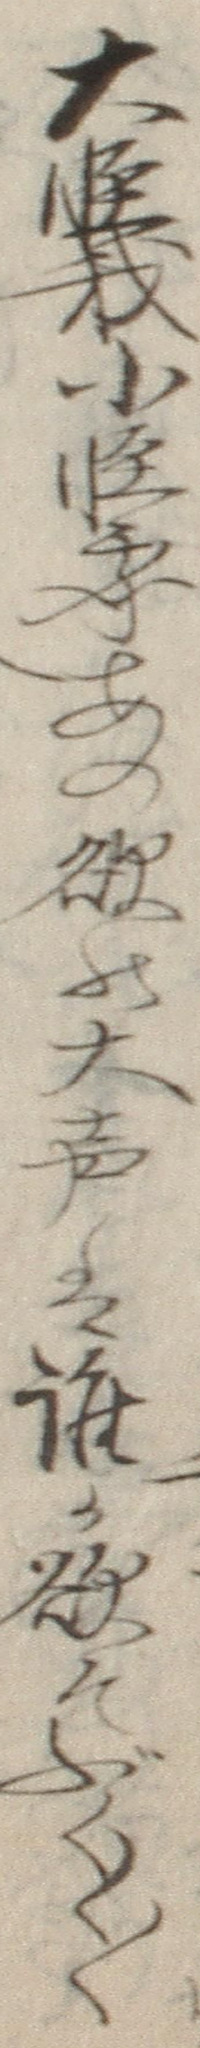大怪我小怪我あの欲の大声は誰か欲そぶく〳〵〳〵〳〵
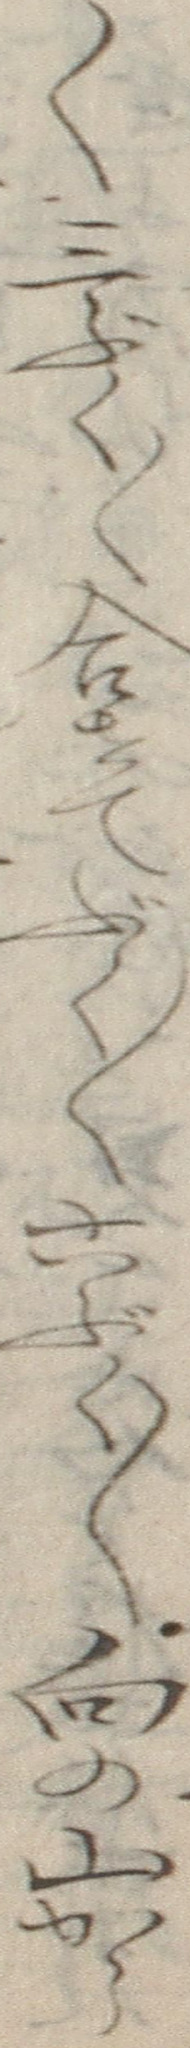〳〵三ぶく〳〵合さてぶく〳〵六ぶく〳〵向の山から
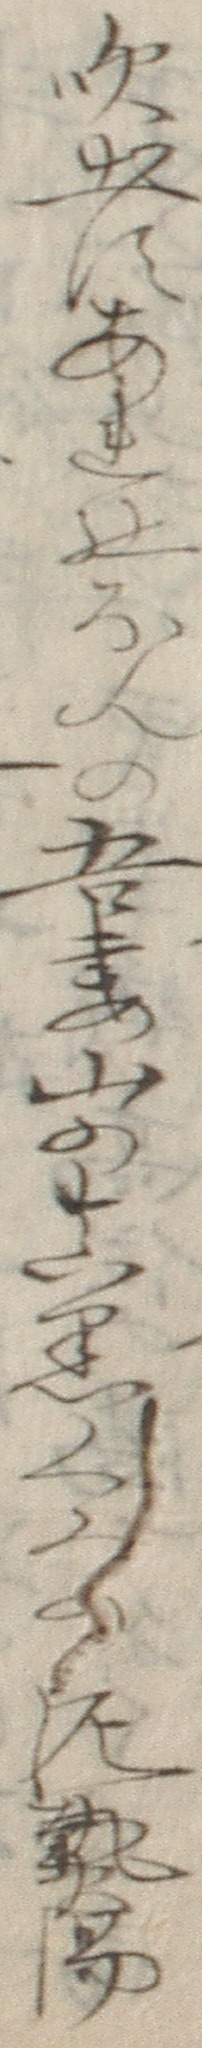吹出すあれはなんの吾妻山の真黒くろの泥熱湯
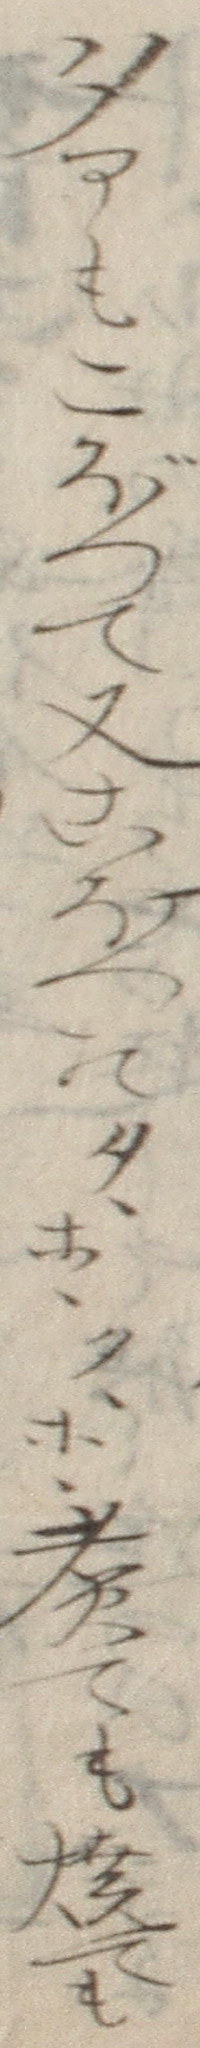タアもこぼつて又こぼつてタボタボ煮ても焼ても
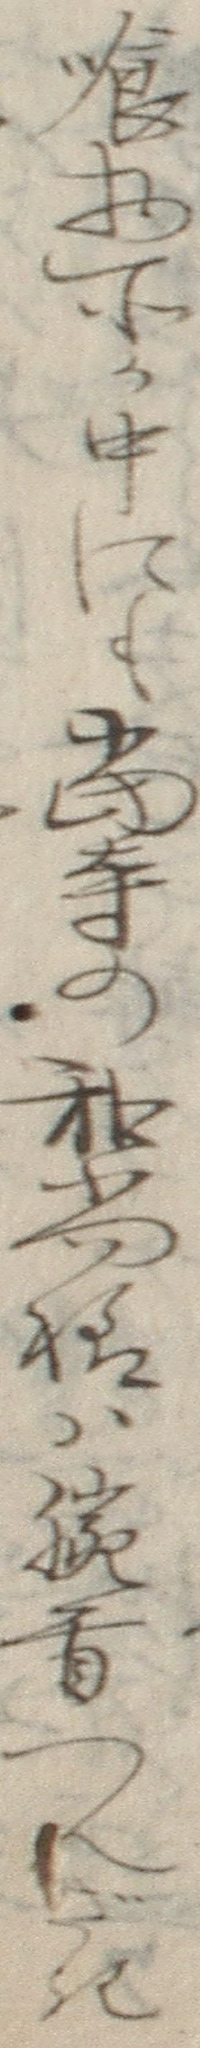喰物所の中にも当時の和尚様は腕首つんざき
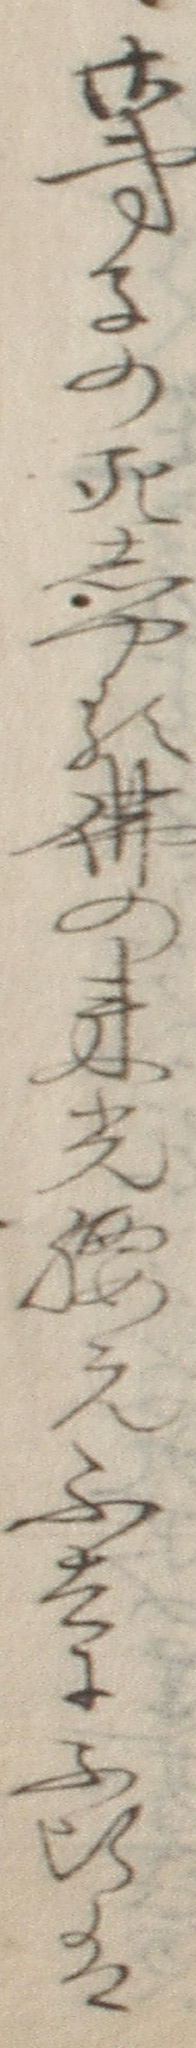御弟子の死しゆる仏の来光腰元ふ去にふ断は

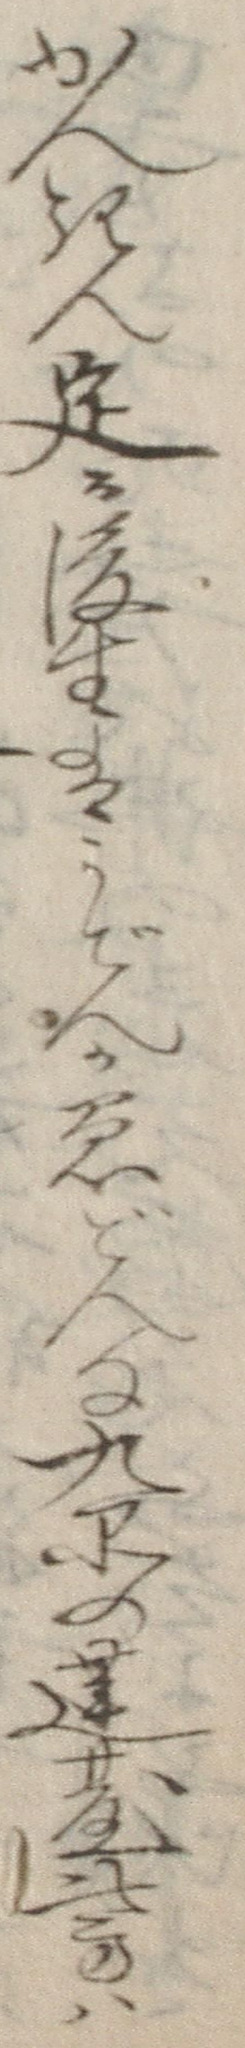かんきん定而後生はうどんか急どんな九品の蓮台此方ハ
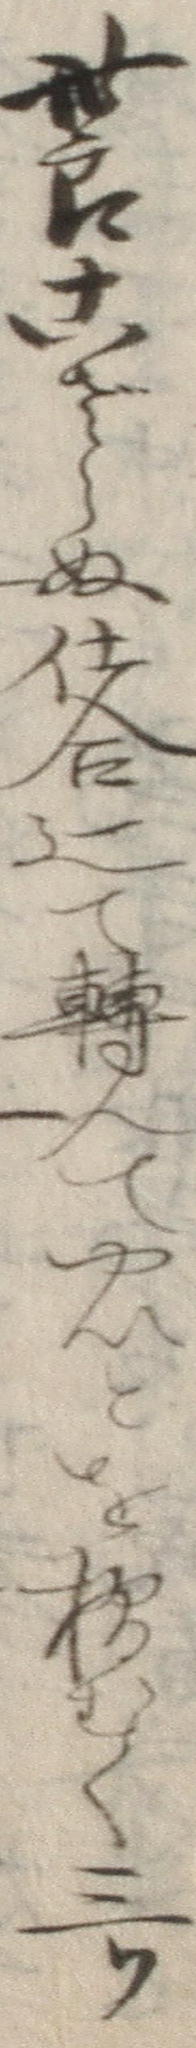此節こざらぬ仕合辷て転んてゆいとを摺むく三リ
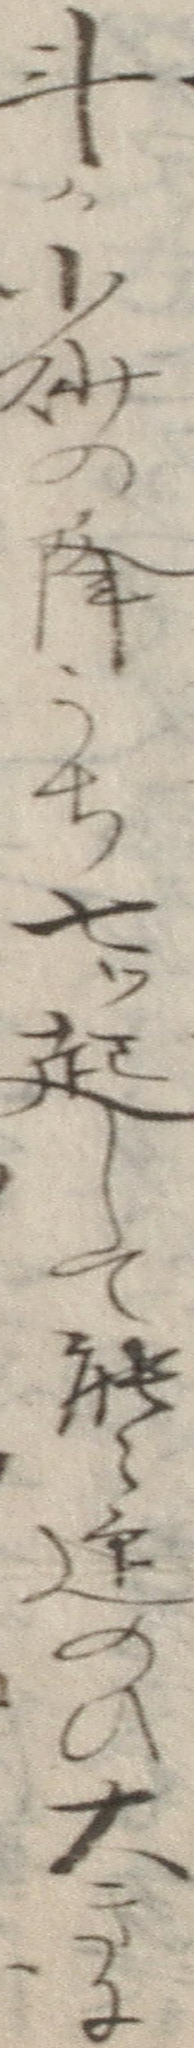斗か小砂の降うち七ツ起して能々迎のひ大きに
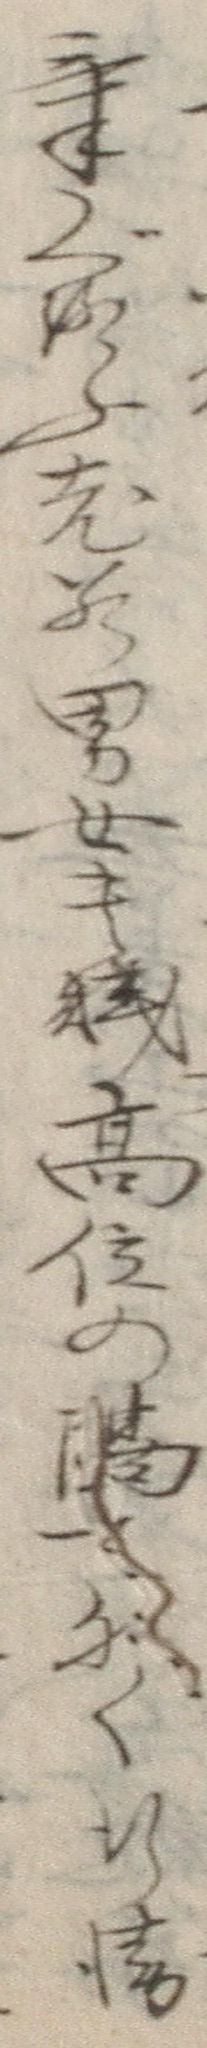気ぐらふ老若男女貴賤高位の隔てなく行衛
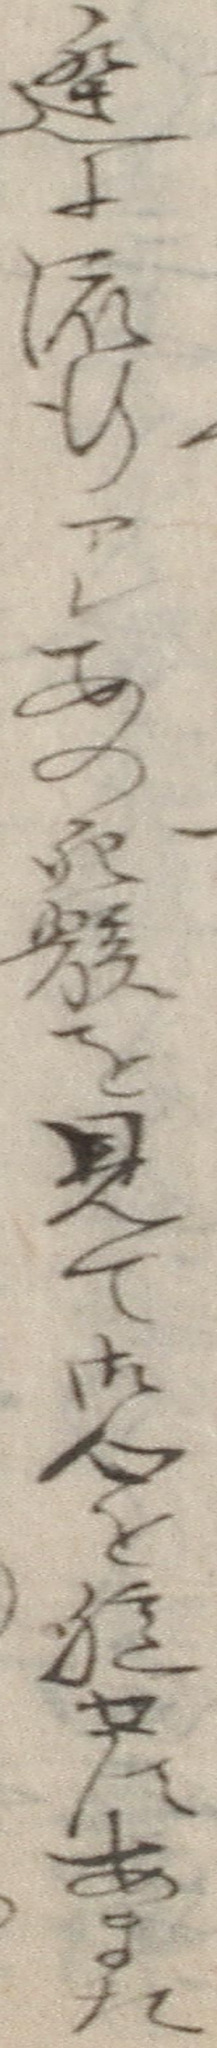逵に流行アレあの死骸を見て御心を臆セすあまた
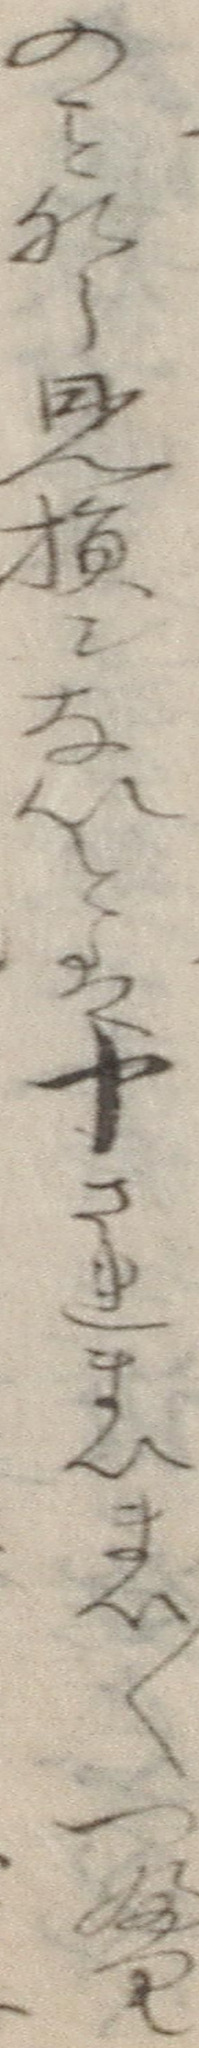のことなし見損シないとは申されまいまい〳〵つふり
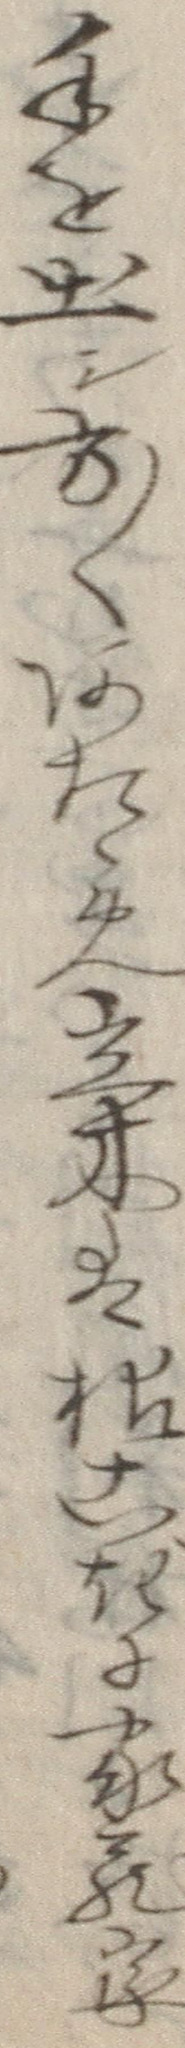手を出シ方〳〵あたため立木は枯こぎに家蔵家
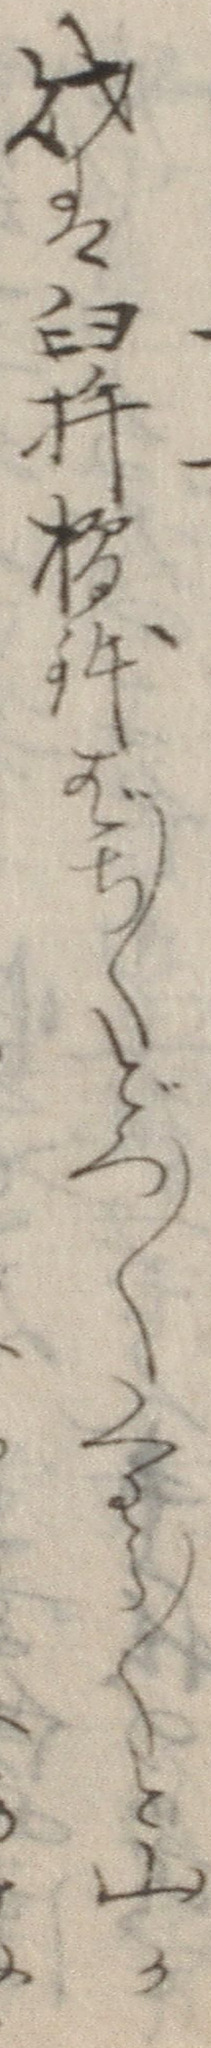財は臼杵摺鉢ばち〳〵どろ〳〵くる〳〵と山か
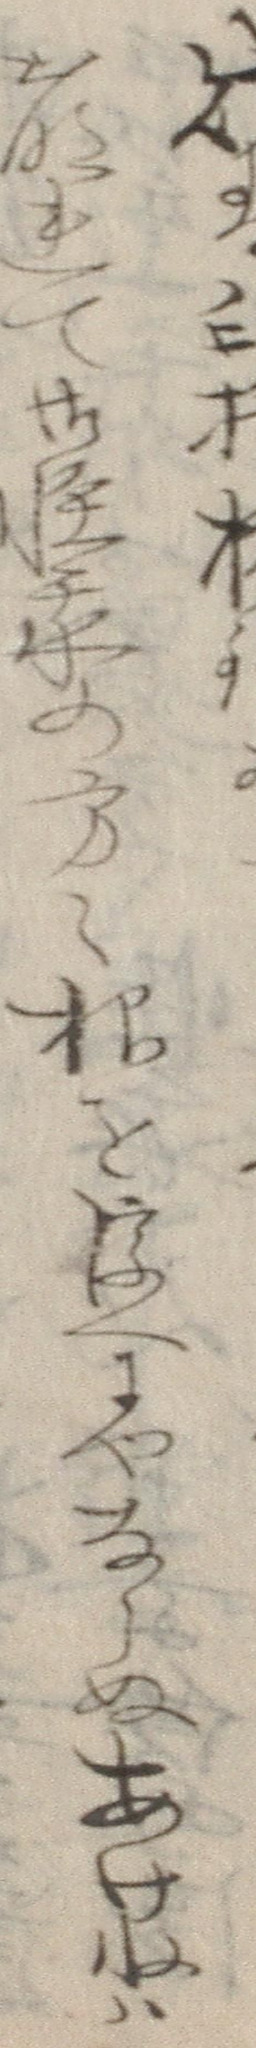崩れて御怪我の方々根を浮へにやならぬあけねハ
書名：[諸国災害記録]
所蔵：東京大学地震研究所図書室 Earthquake Research Institute Library, The University of Tokyo, JAPAN
